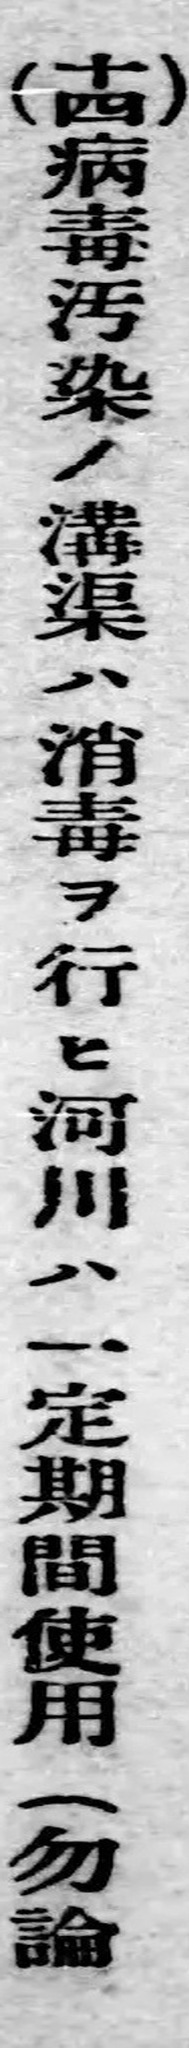(十四)病毒汚染ノ溝渠ハ消毒ヲ行ヒ河川ハ一定期間使用(勿論
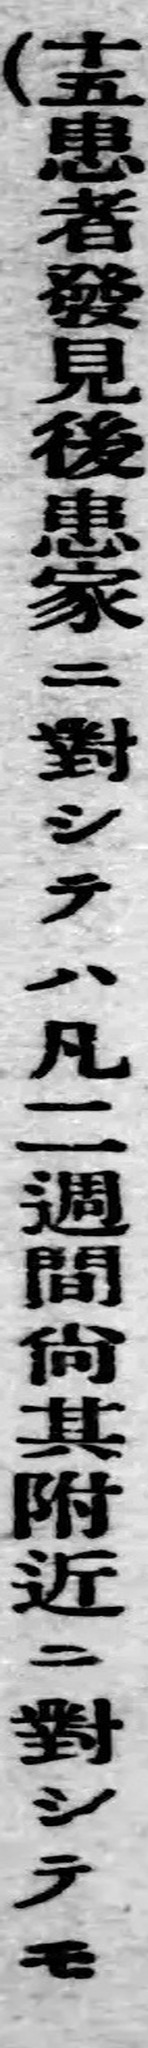(十五)患者發見後患家ニ對シテハ凡二週間尚其附近ニ對シテモ
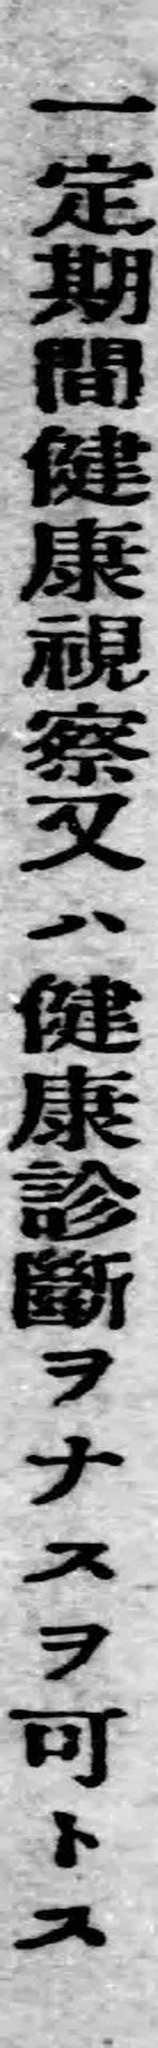一定期間健康視察又ハ健康診斷ヲナスヲ可トス

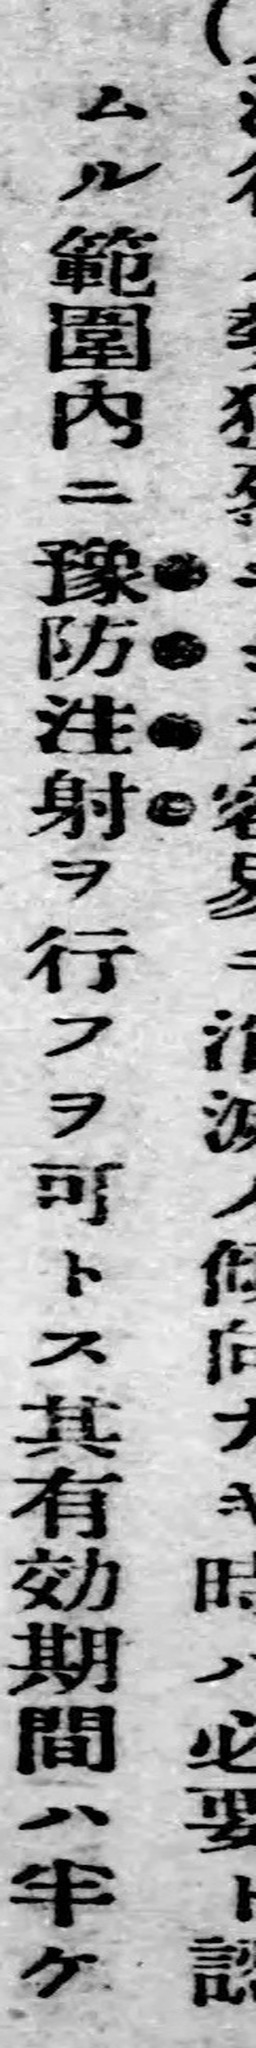ムル範圍内ニ豫防注射ヲ行フヲ可トス其有効期間ハ半ヶ
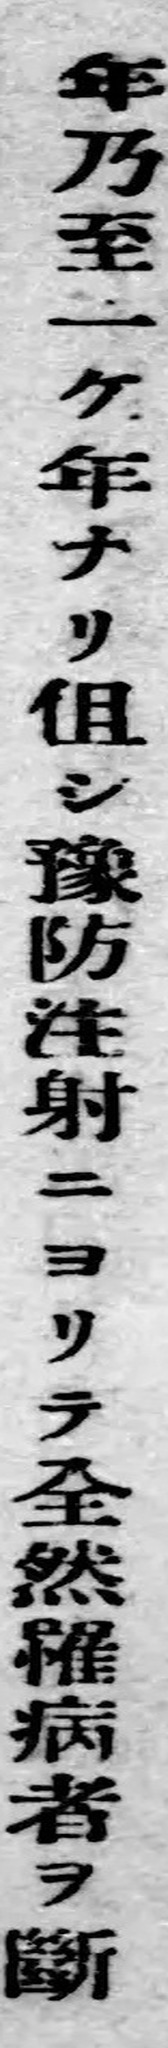年乃至一ヶ年ナリ伹シ豫防注射ニヨリテ全然罹病者ヲ斷
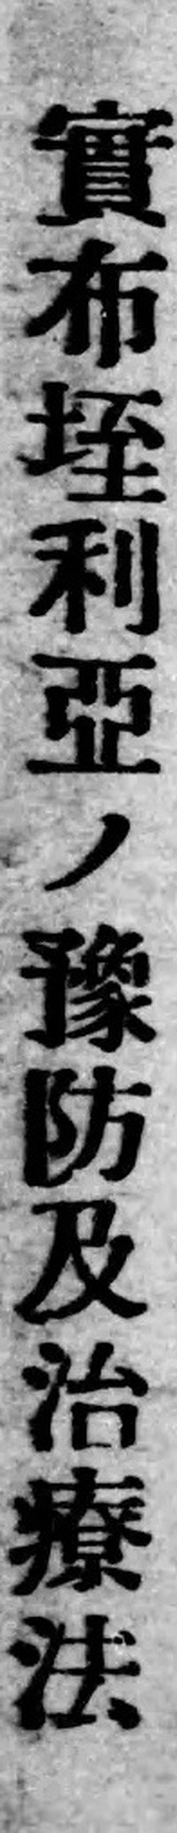實布垤利亞ノ豫防及治療法
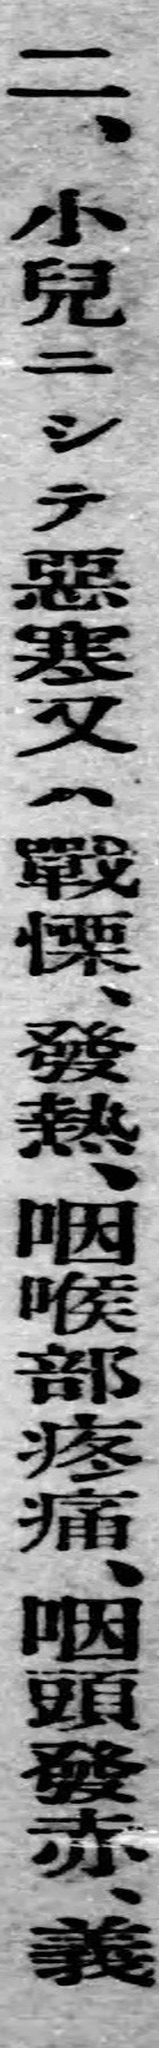二、小兒ニシテ惡寒又ハ戰慄、發熱、咽喉部疼痛、咽頭發赤、義
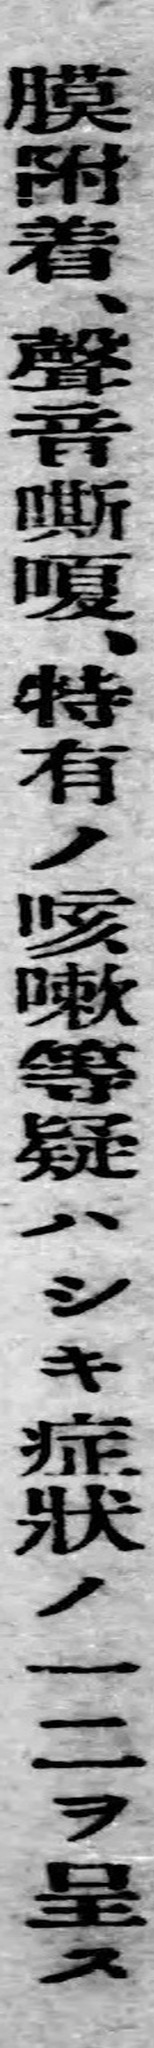膜附着、聲音嘶嗄、特有ノ咳嗽等疑ハシキ症狀ノ一二ヲ呈ス
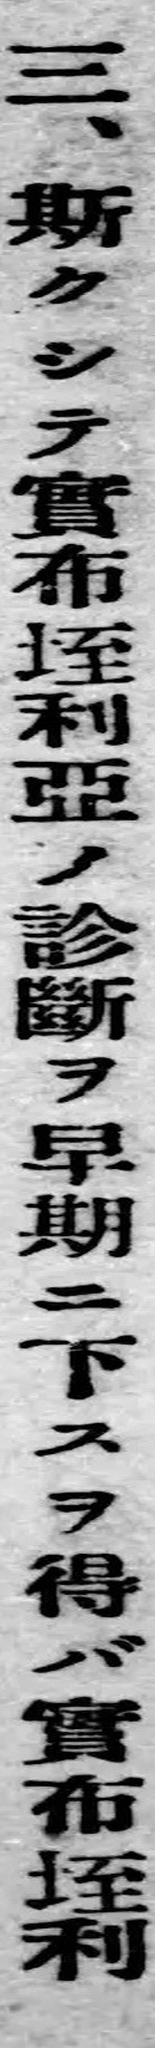三、斯クシテ實布垤利亞ノ診斷ヲ早期ニ下スヲ得バ實布垤利
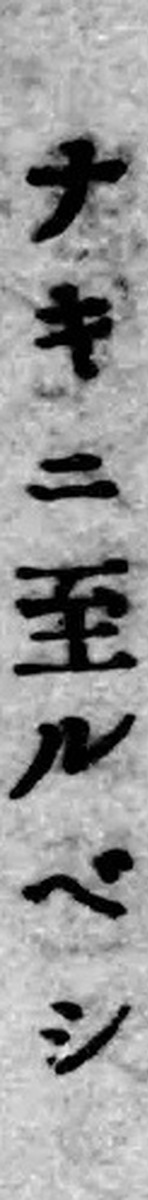ナキニ至ルベシ

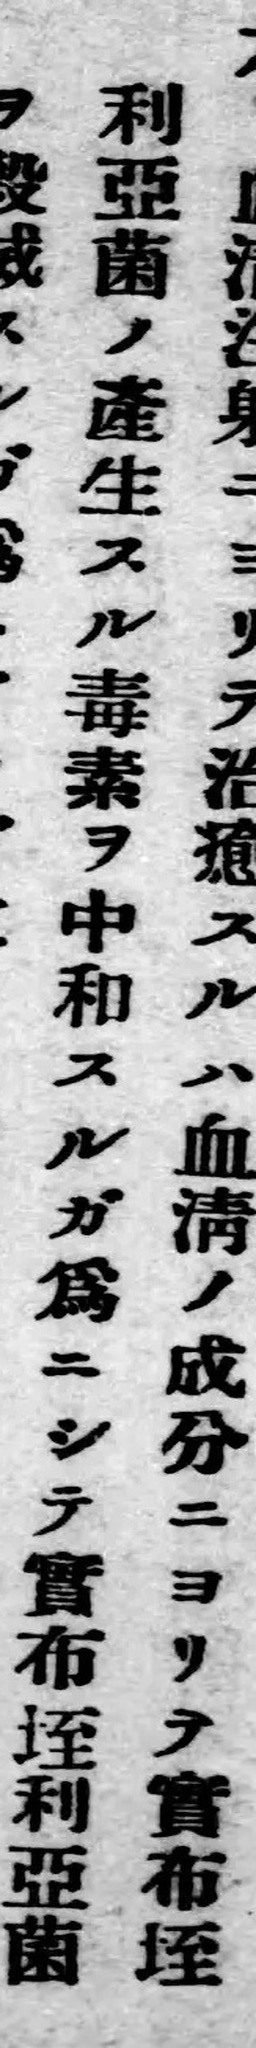利亞菌ノ產生スル毒素ヲ中和スルガ爲ニシテ實布垤利亞菌
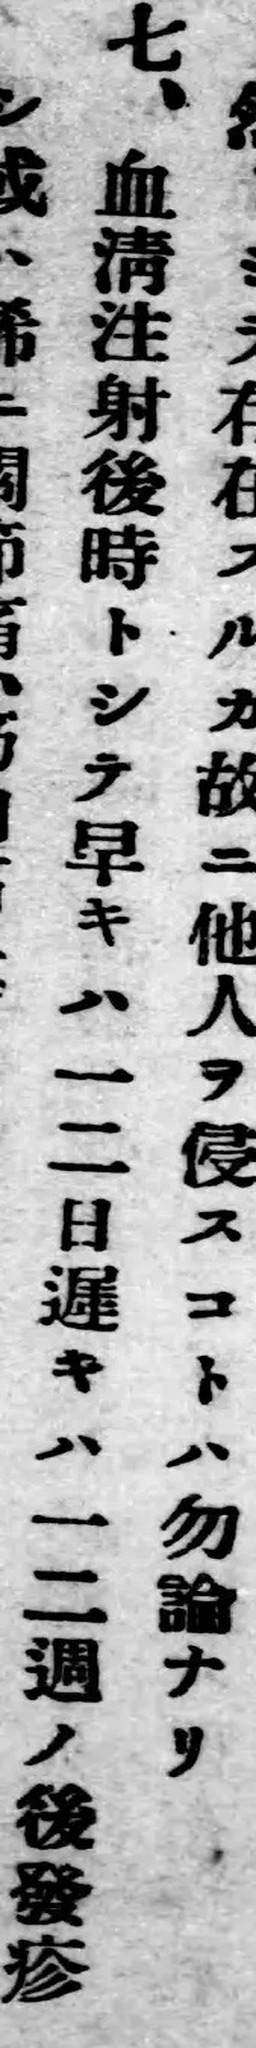七、血淸注射後時トシテ早キハ一二日遲キハ一二週ノ後發疹
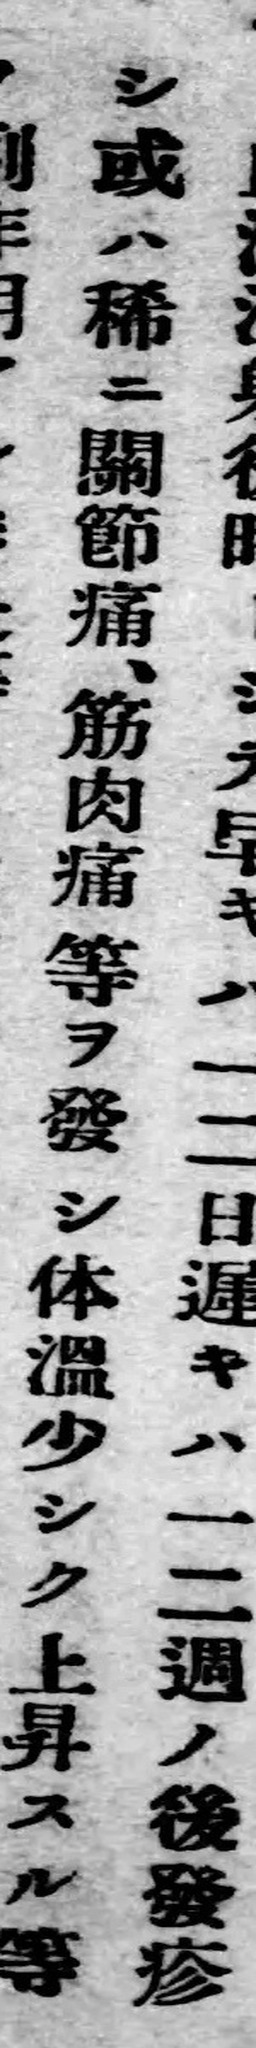シ或ハ稀ニ關節痛、筋肉痛等ヲ發シ体溫少シク上昇スル等
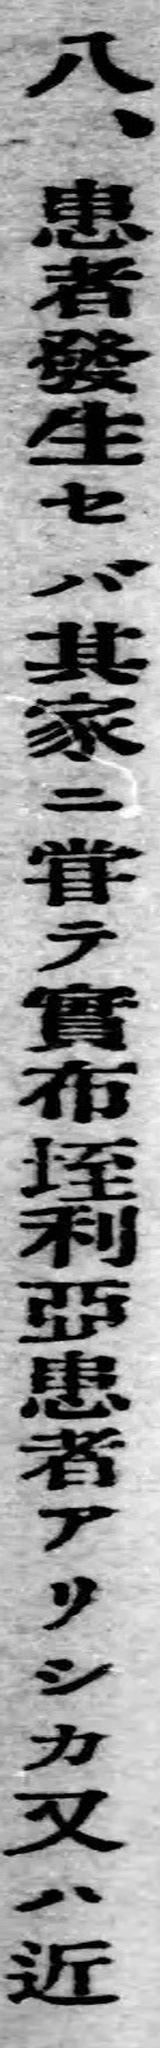八、患者發生セバ其家ニ甞テ實布垤利亞患者アリシカ又ハ近
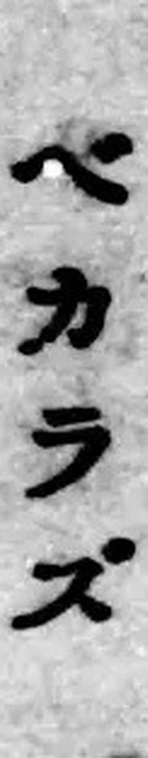ベカラズ
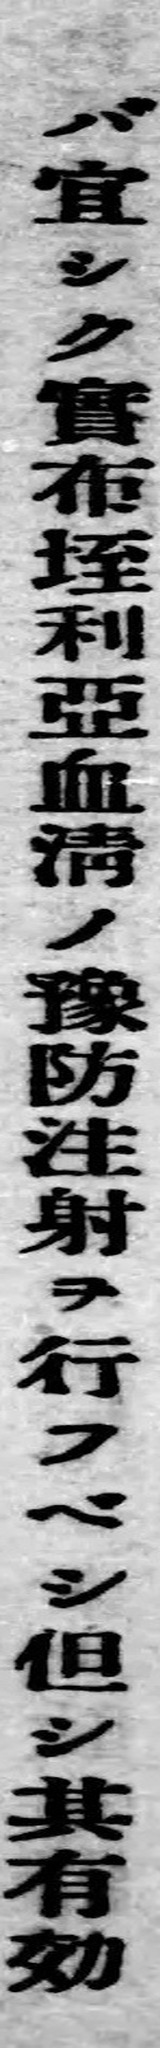バ宜シク實布垤利亞血淸ノ豫防注射ヲ行フベシ但シ其有効
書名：袖珍防疫必携
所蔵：国立国会図書館 National Diet Library, JAPAN
